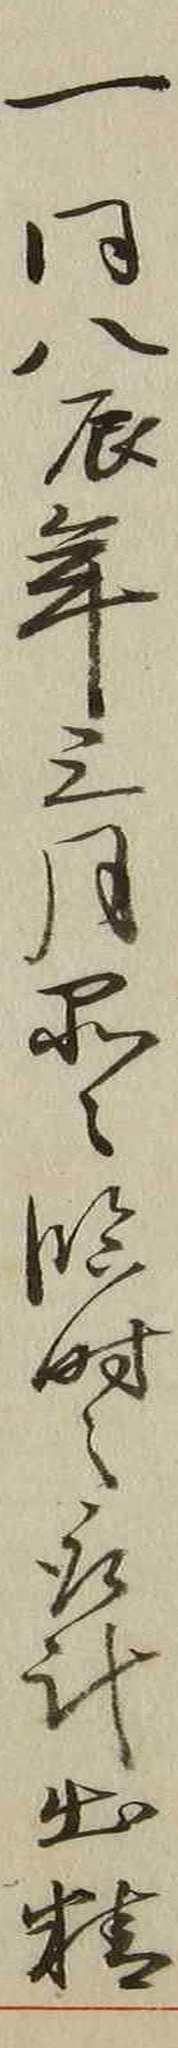一同八辰年三月品々臨時之取計出精
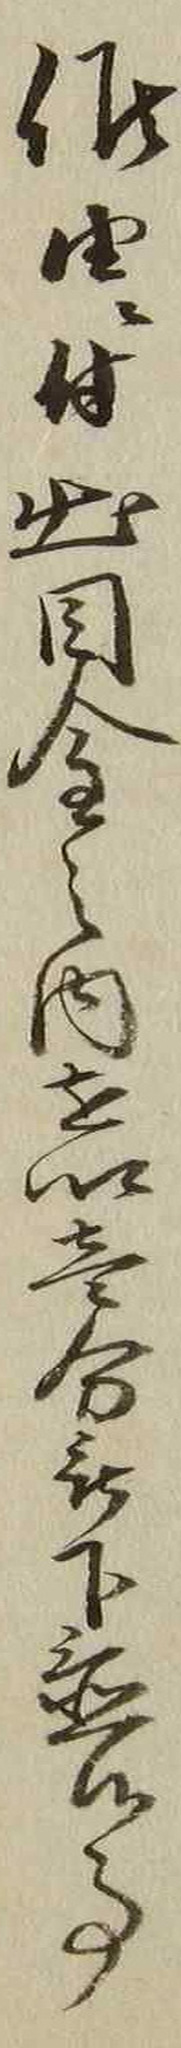候由ニ付出目金之内を以壱分被下置候事
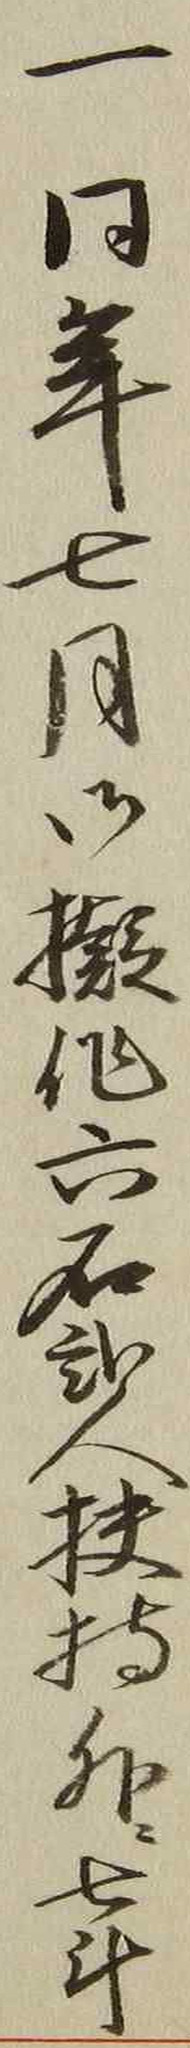一同年七月御擬作六石弐人扶持外ニ七斗
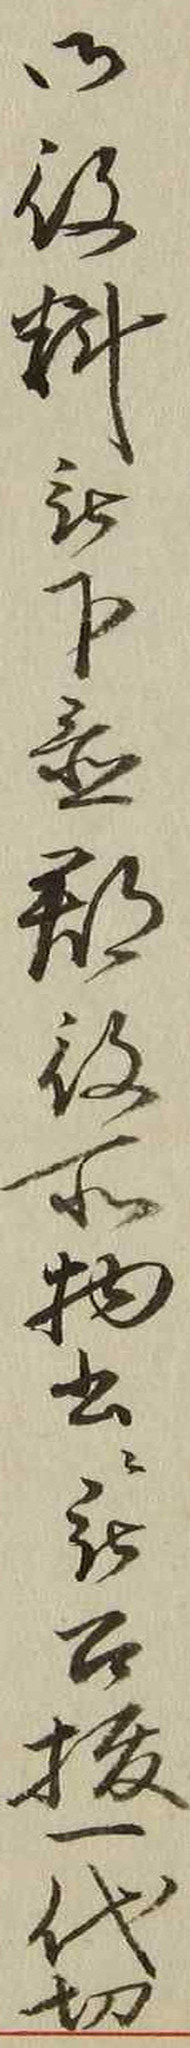御役料被下置郡役所物書ニ被召抜一代切
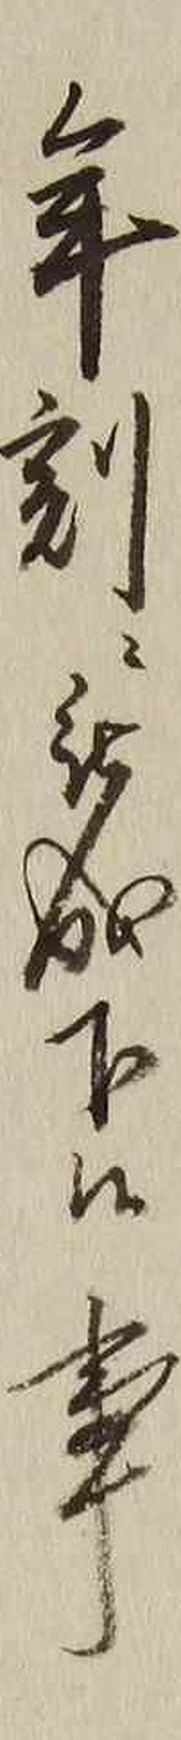年割ニ被成下候事
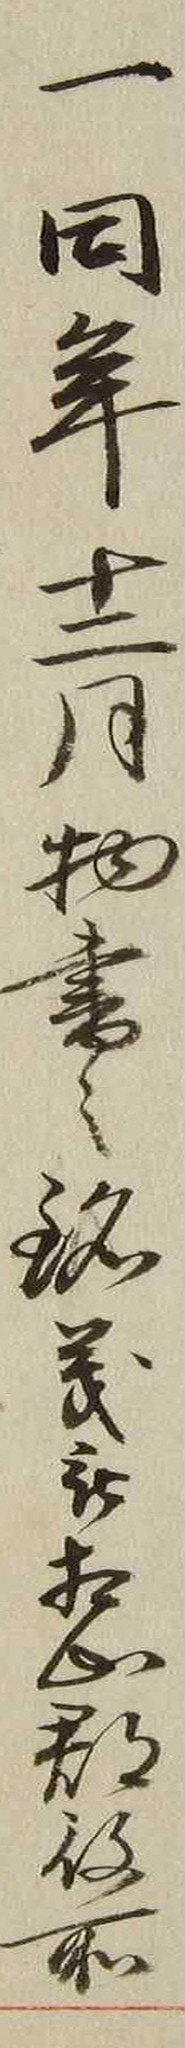一同年十二月物書之銘義被相止郡役所
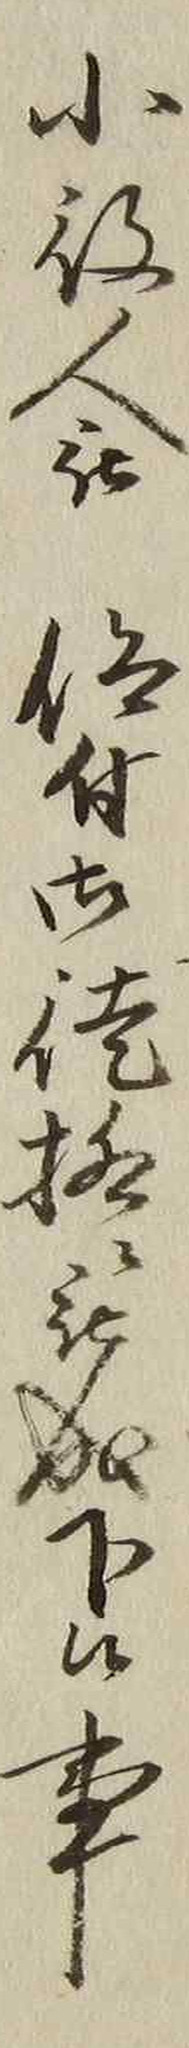小役人被仰付御徒格ニ被成下候事
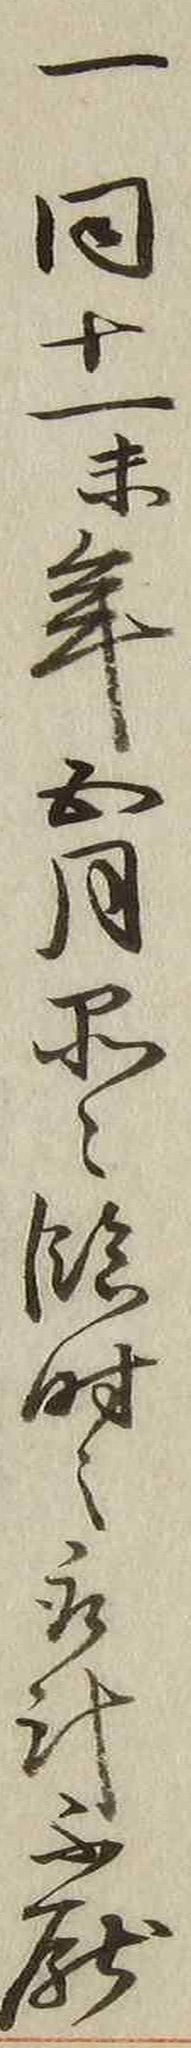一同十一未年五月品々臨時之取計不厭
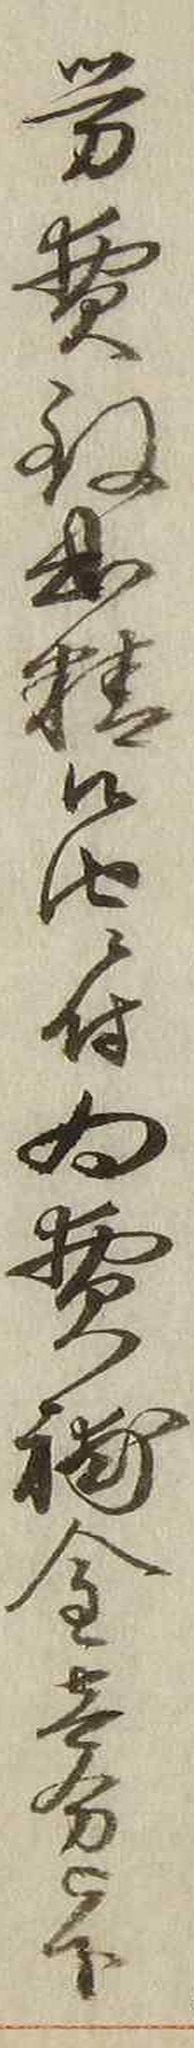労費致出精候由ニ付為費補金壱分被下
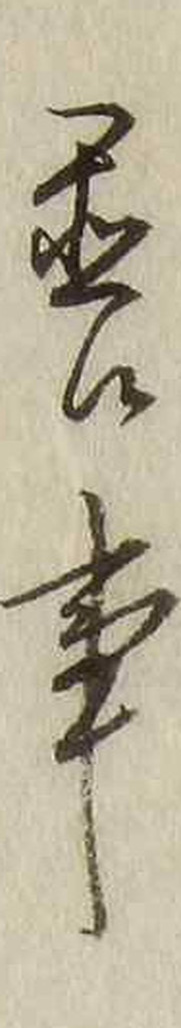置候事
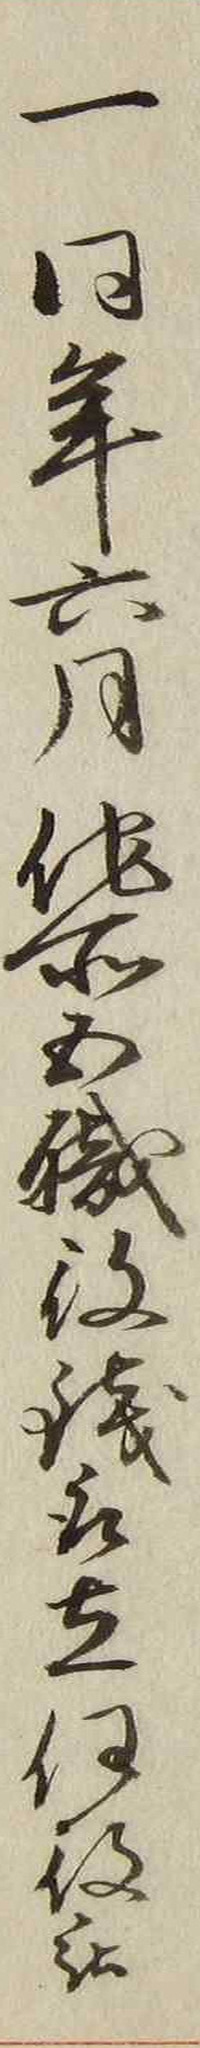一同年六月他所五職役銭取立任役被
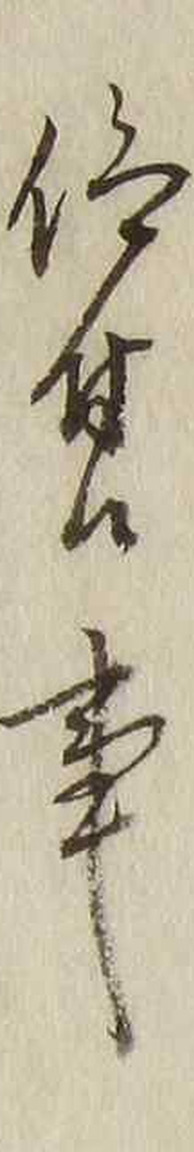仰付候事
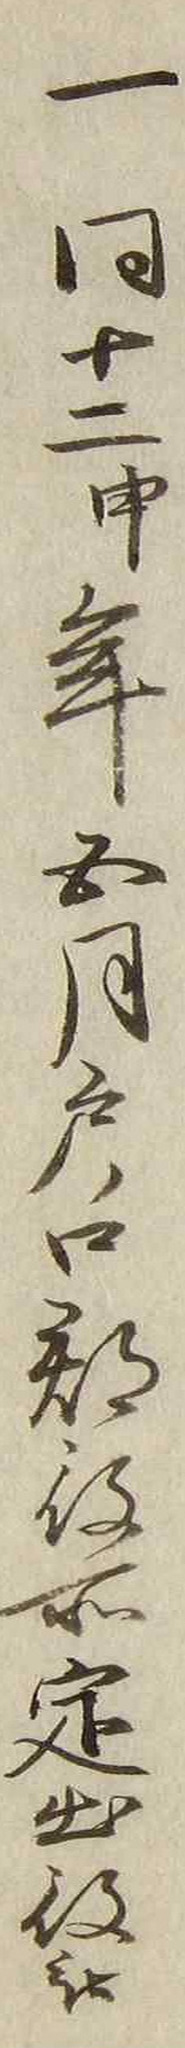一同十二申年五月戸ノ口郡役所定出役被
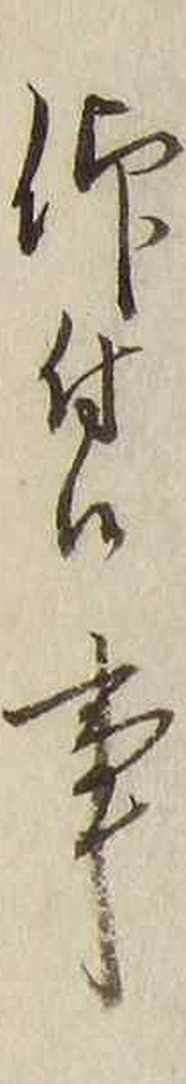仰付候事

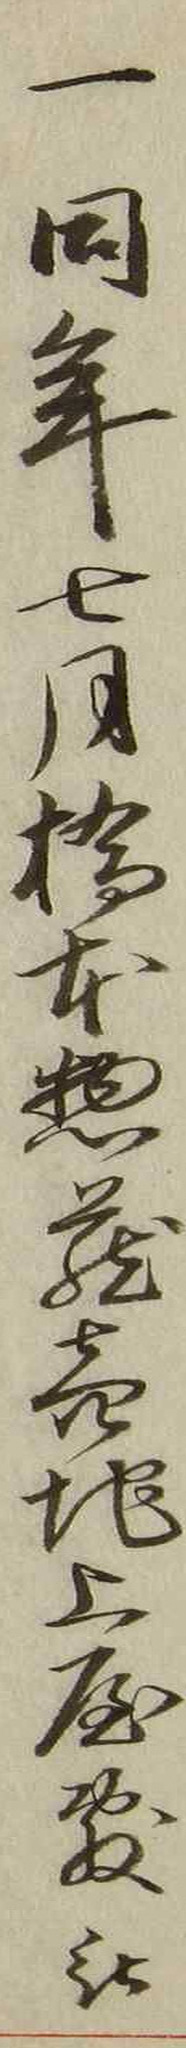一同年七月橋本惣蔵売地上屋敷被
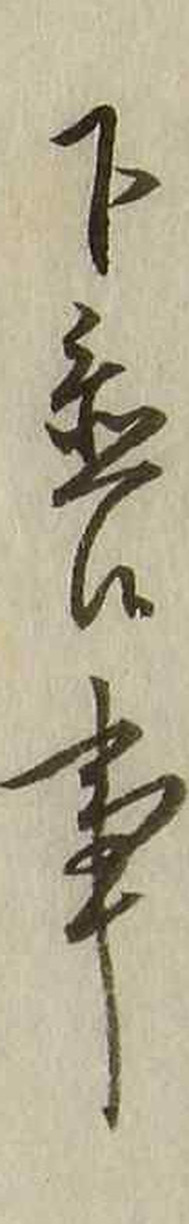下置候事
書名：諸士系譜　巻之102　か之部10
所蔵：会津若松市立会津図書館
